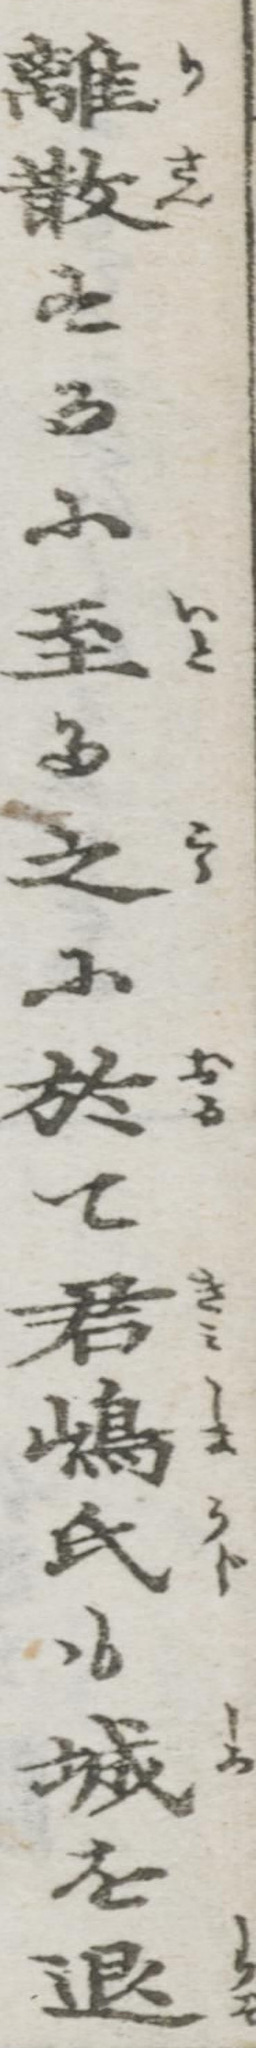離散するに至る之に於て君島氏も城を退
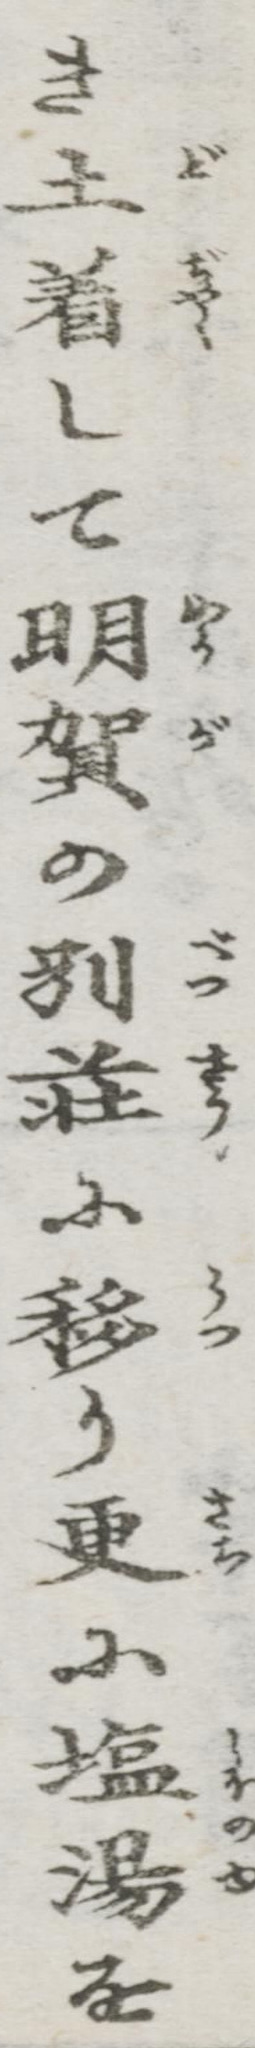き土着して明賀の別荘に移り更に塩湯を
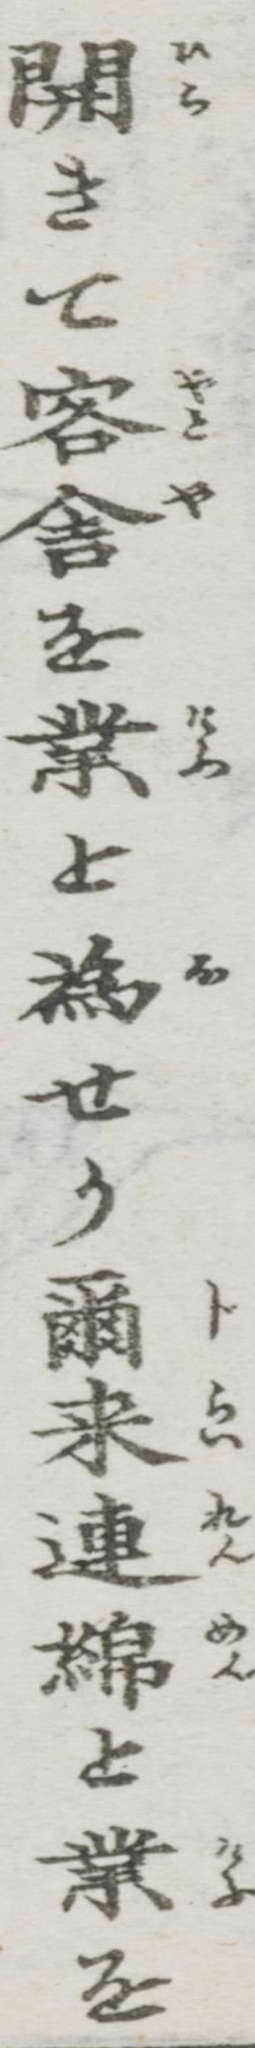開きて客舎を業と為せり爾来連綿と業を
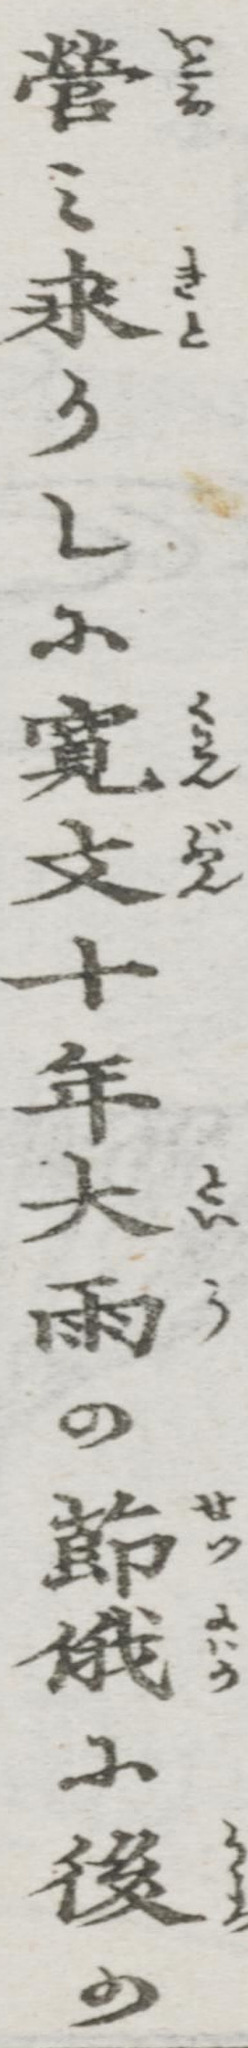営み来りしに寛文十年大雨の節俄に後の
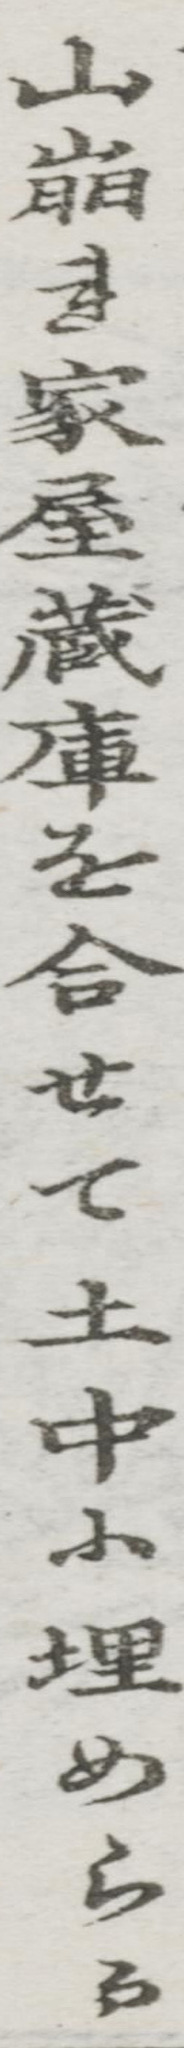山崩れ家屋蔵庫を合せて土中に埋めらる
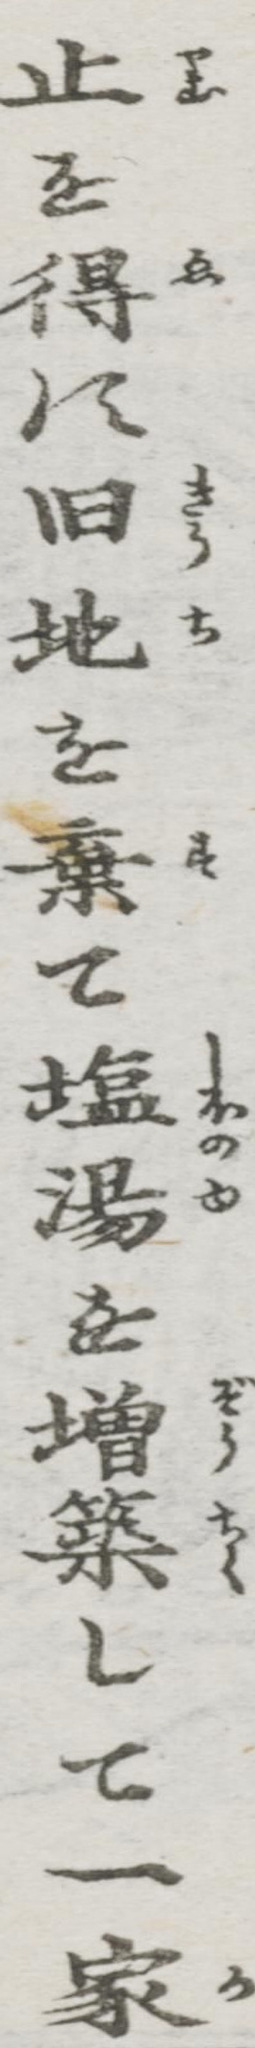止を得す旧地を棄て塩湯を増築して一家
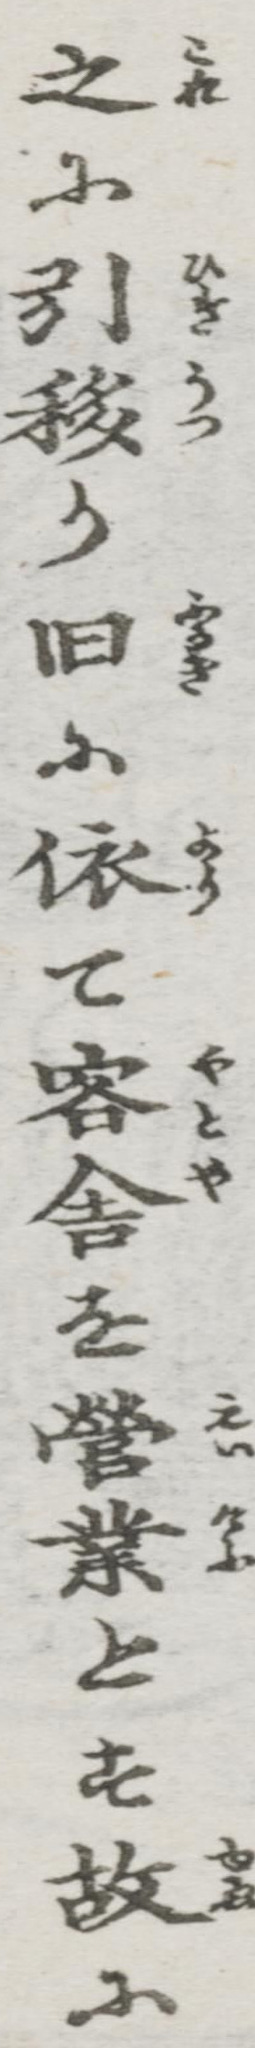之に引移り旧に依て客舎を営業とす故に
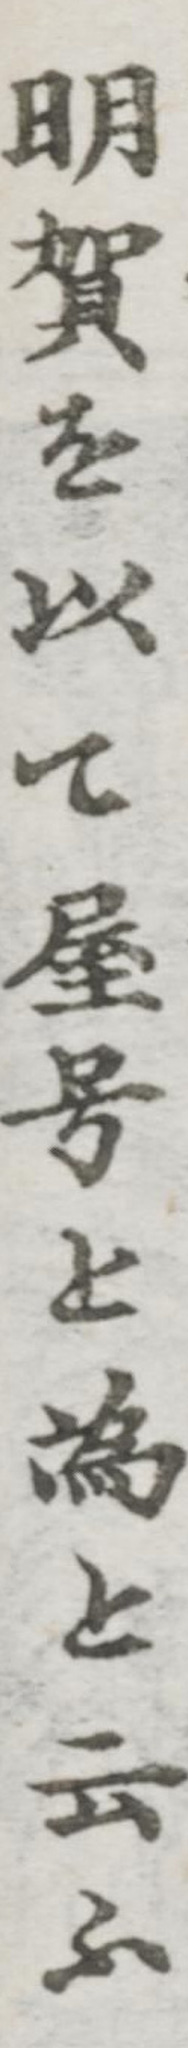明賀を以て屋号と為と云ふ
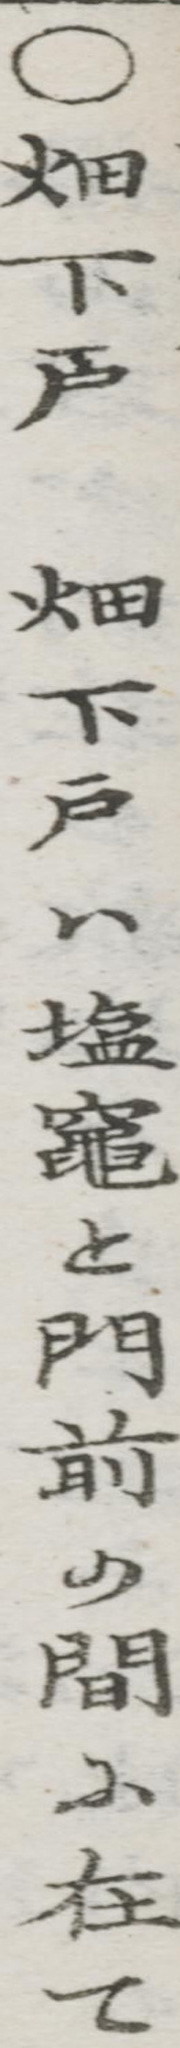○畑下戸畑下戸は塩竈と門前の間に在て
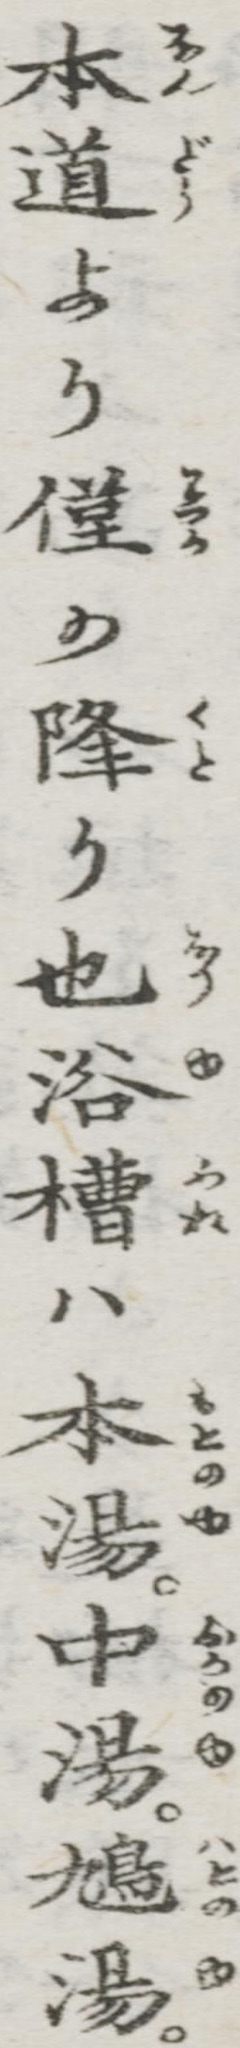本道より僅の降り也浴槽は本湯。中湯。鳩湯。
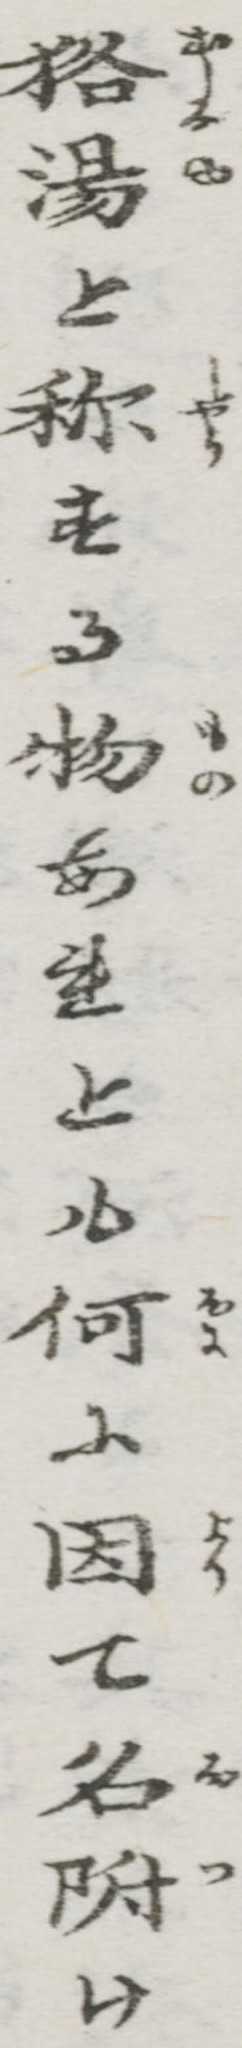貉湯と称する物あれとも何に因て名附け
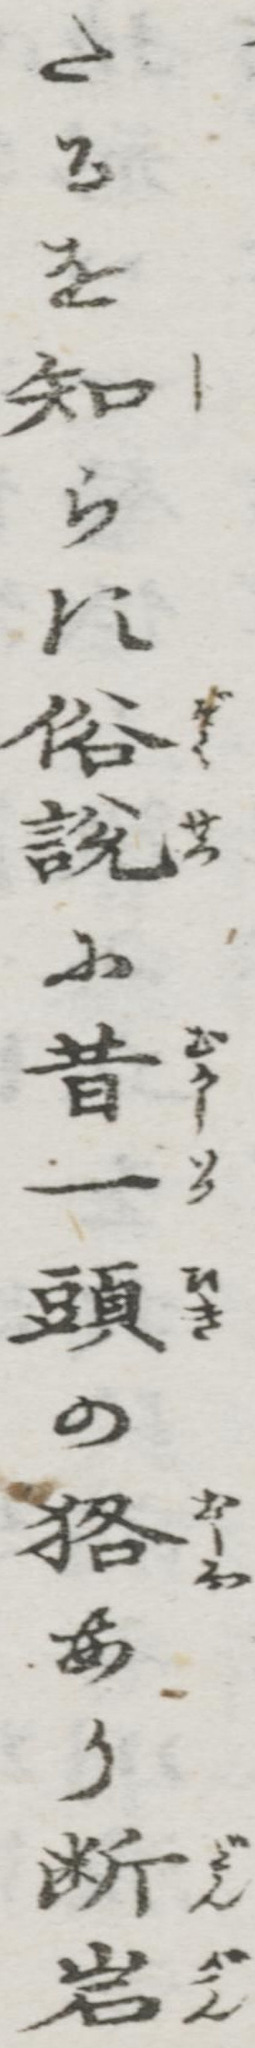たるを知らす俗説に昔一頭の貉あり断岩
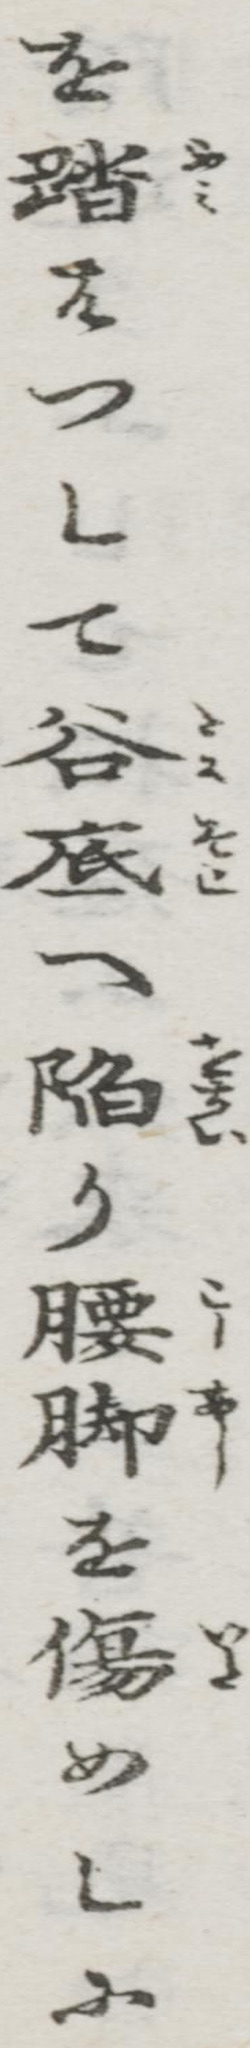を踏はつして谷底へ陥り腰脚を傷めしに
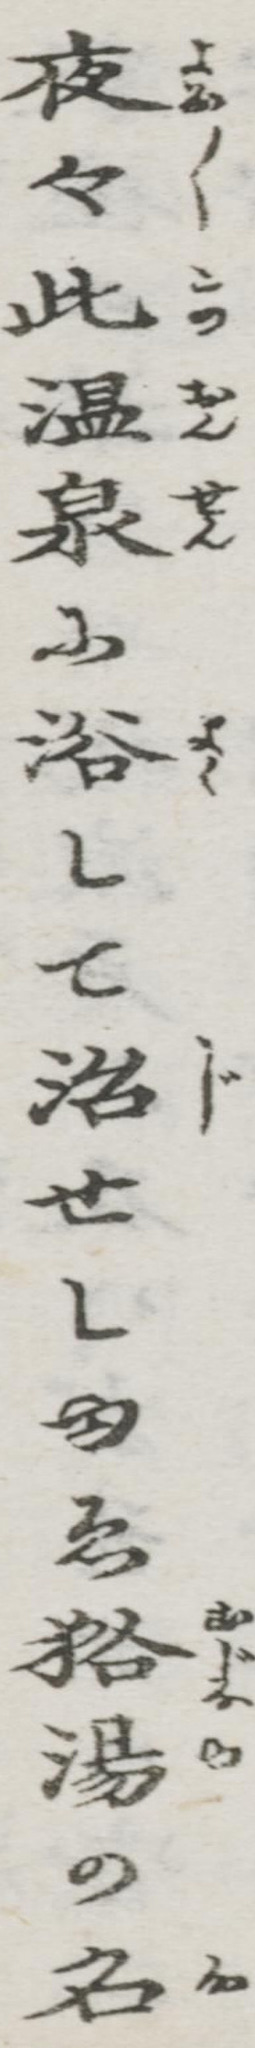夜々此温泉に浴して治せしゆゑ貉湯の名
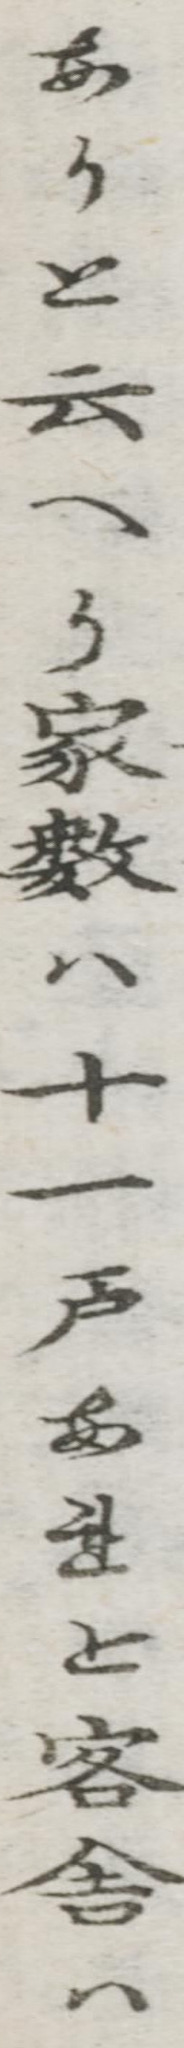ありと云へり家数は十一戸あれと客舎は

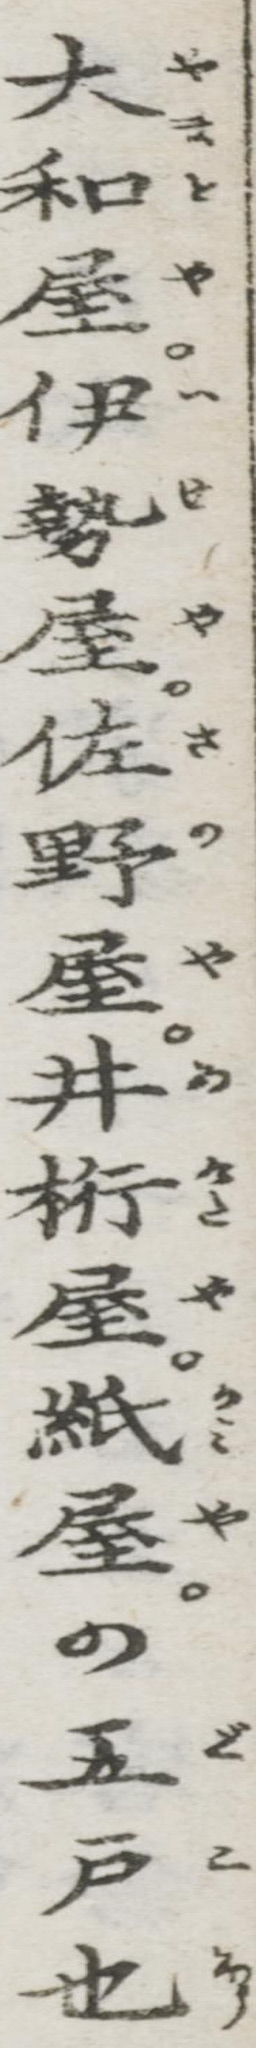大和屋。伊勢屋。佐野屋。井桁屋。紙屋。の五戸也
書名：塩原繁昌記　全
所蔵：東京大学地震研究所図書室 Earthquake Research Institute Library, The University of Tokyo, JAPAN
